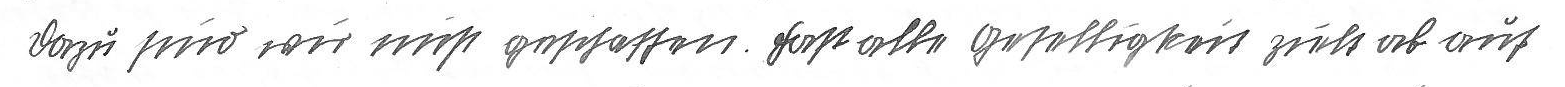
Dazu sind wir nicht geschaffen. Fast alle Geselligkeit zielt ab auf
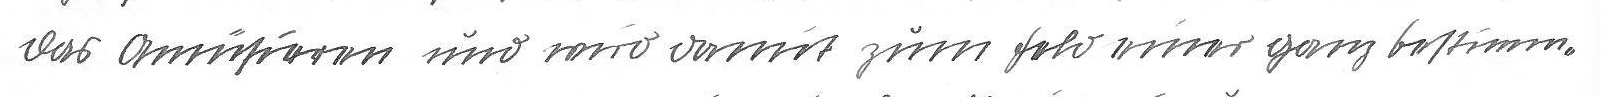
das Amüsieren und wird damit zum Feld einer ganz bestimm¬
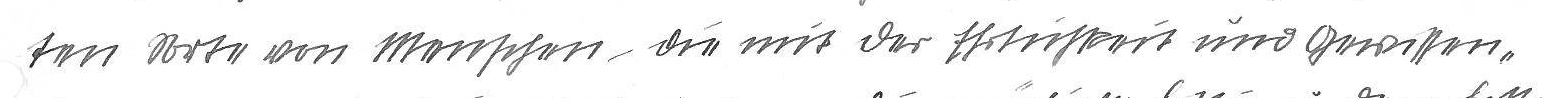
ten Sorte von Menschen, die mit der Ehrlichkeit und Gewissen¬
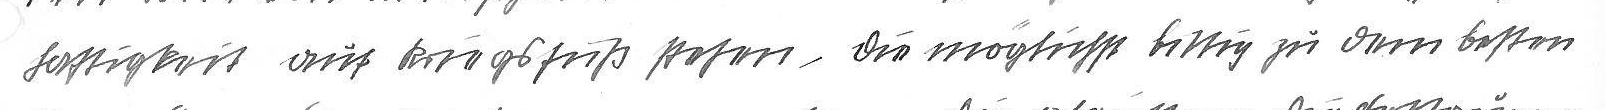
haftigkeit auf Kriegsfuß stehen, die möglichst billig zu den besten
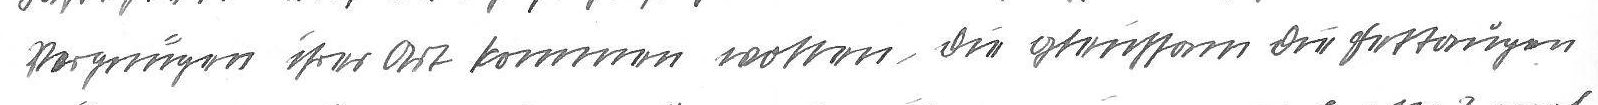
Vergnügen ihrer Art kommen wollen, die gleichsam die Fettaugen
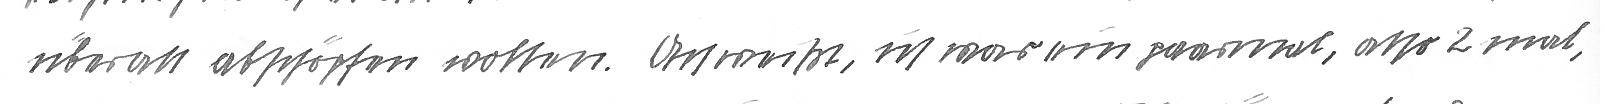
überall abschöpfen wollen. Ach weist, ich war ein paarmal, also 2 mal,
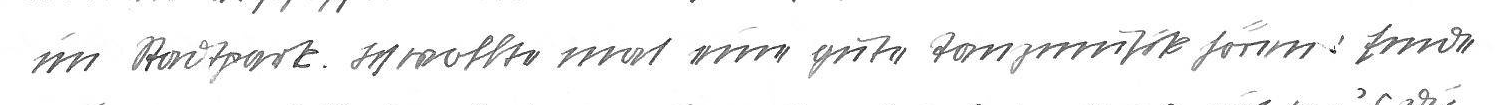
im Stadtpark. Ich wollte mal eine gute Tanzmusik hören: Emde
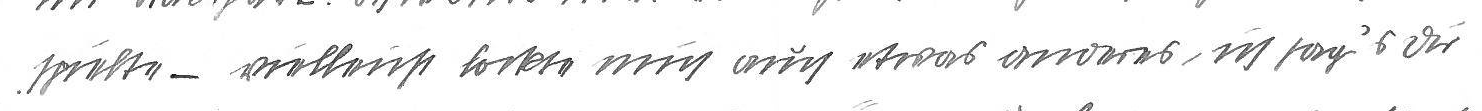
spielte – vielleicht lockte mich auch etwas anderes, ich sag´s Dir
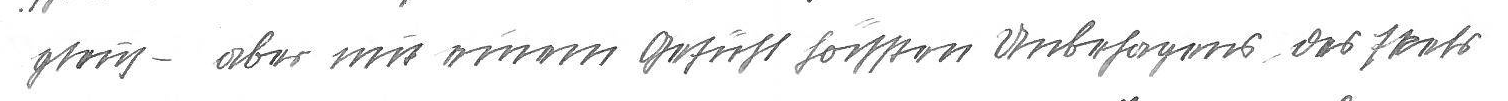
gleich – aber mit einem Gefühl höchsten Unbehagens, des Ekels
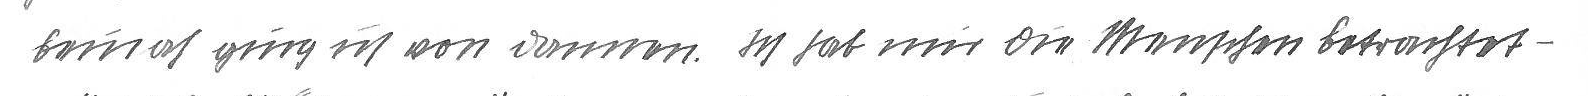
beinahe ging ich von dannen. Ich hab nur die Menschen betrachtet –
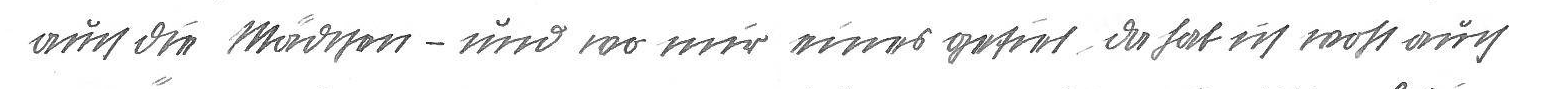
auch die Mädchen – und wo mir eines gefiel, da hab ich wohl auch
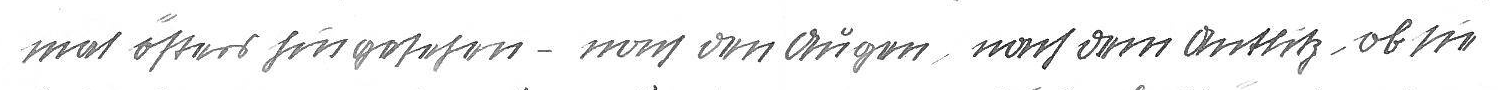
mal öfters hingesehen – nach den Augen, nach dem Antlitz – ob sie
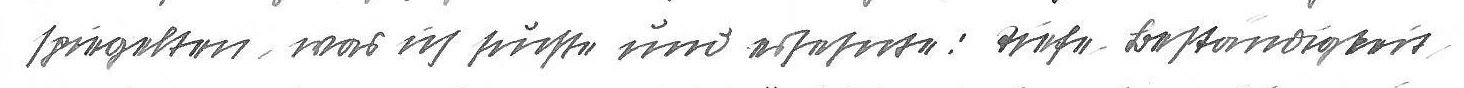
spiegelten, was ich suchte und ersuchte: Tiefe. Beständigkeit,
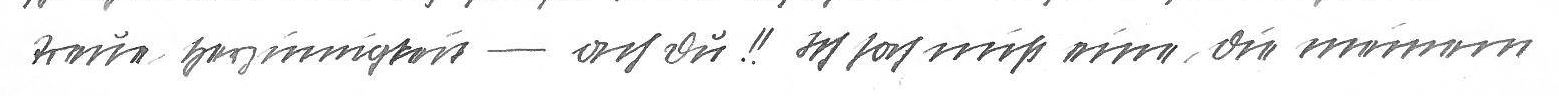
Treue, Herzinnigkeit – ach Du!! Ich sah nicht eine, die meinem
